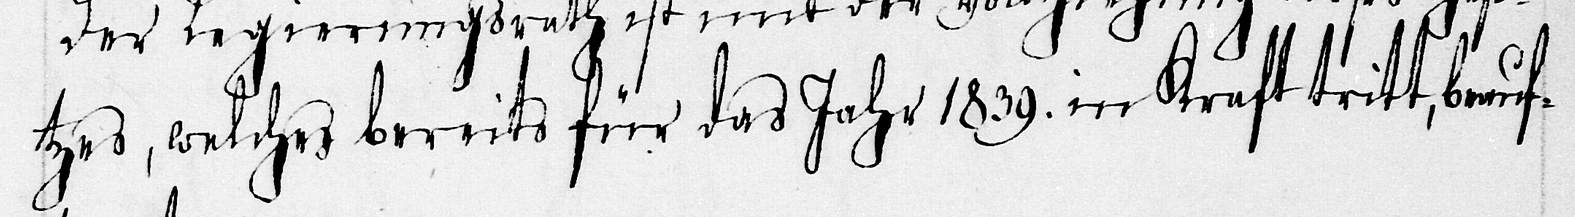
tzes, welches bereits für das Jahr 1839. in Kraft tritt, beauf¬
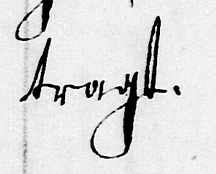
tragt.
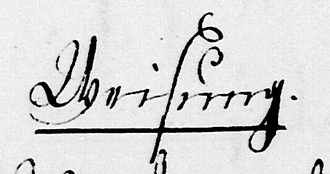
Weisung.
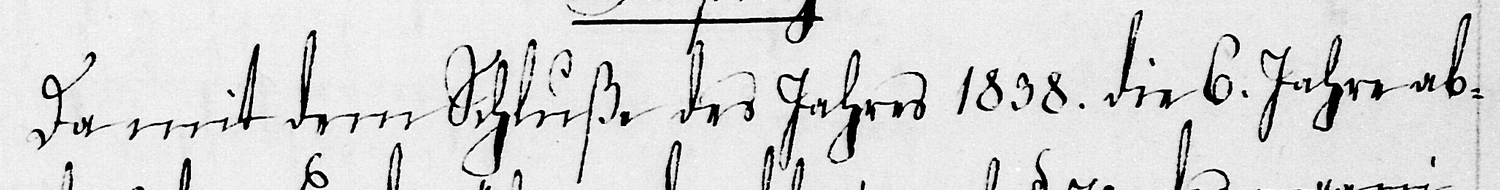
Da mit dem Schluße des Jahres 1838. die 6. Jahre ab¬
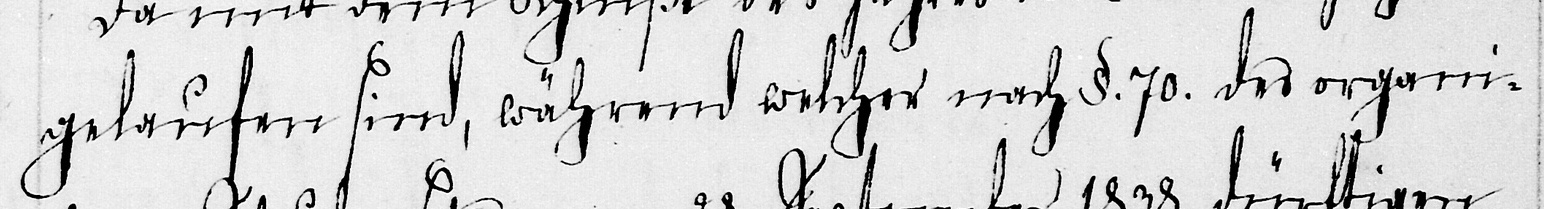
gelaufen sind, während welcher nach §. 70. des organi¬
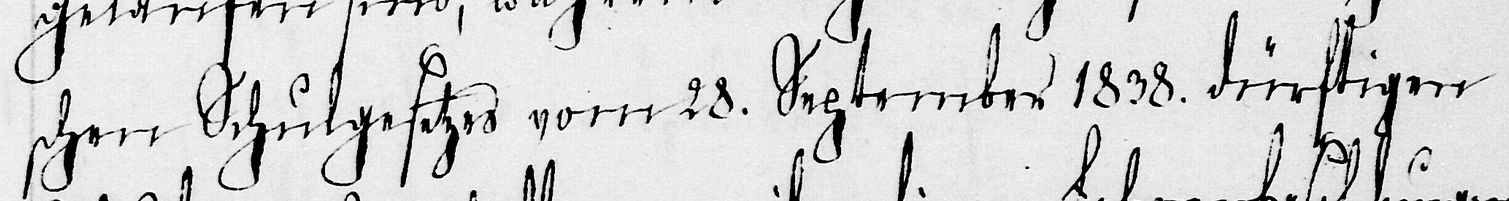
schen Schulgesetzes vom 28. September 1838. dürftigen
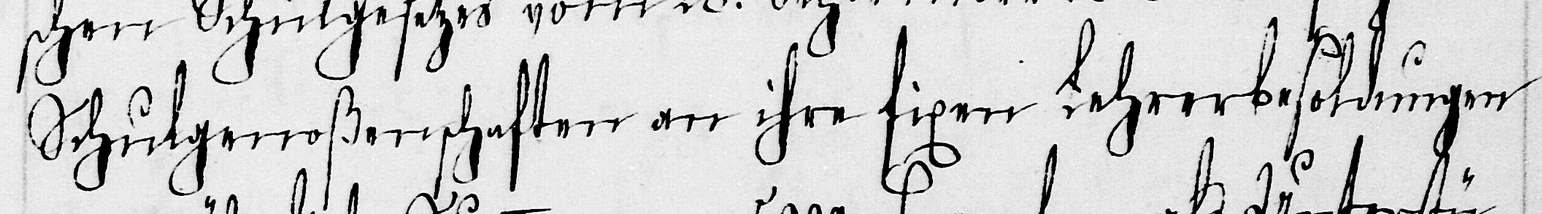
Schulgenoßenschaften an ihre fixen Lehrerbesoldungen
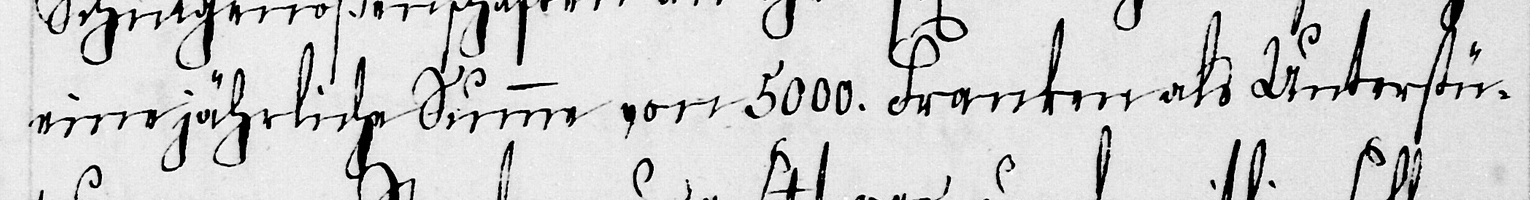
eine jährliche Summe von 5000. Franken als Unterstü¬
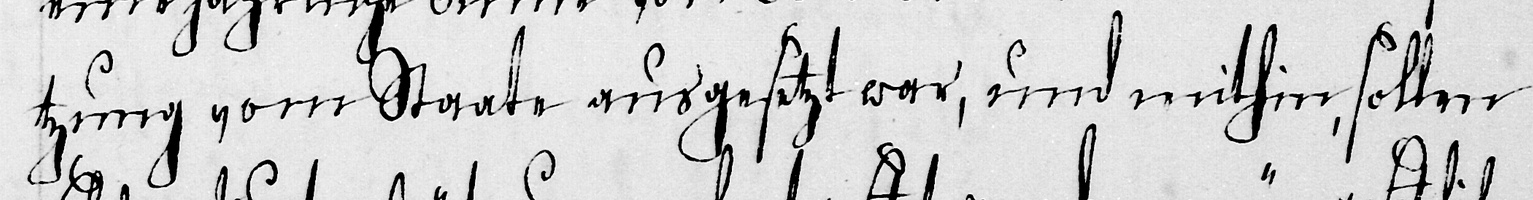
tzung vom Staate ausgesetzt war, und mithin, sollen
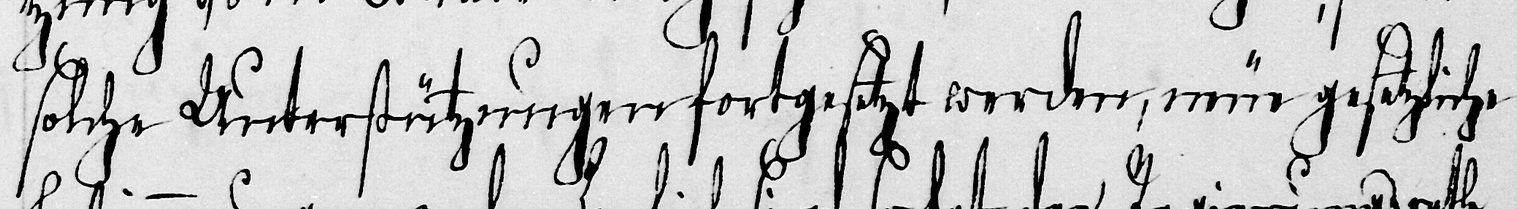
solche Unterstützungen fortgesetzt werden, neue gesetzliche
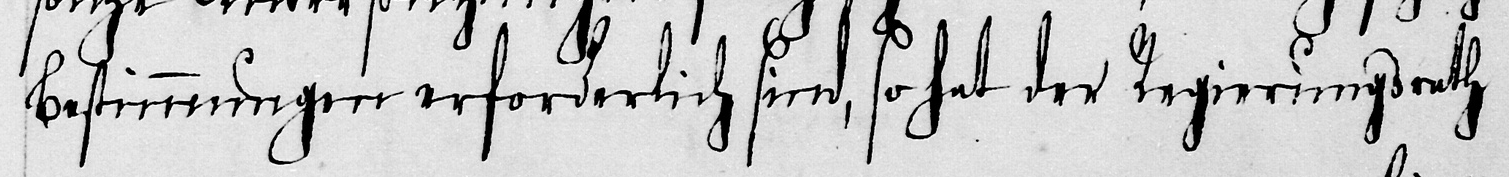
Bestimmungen erforderlich sind, so hat der Regierungsrath
